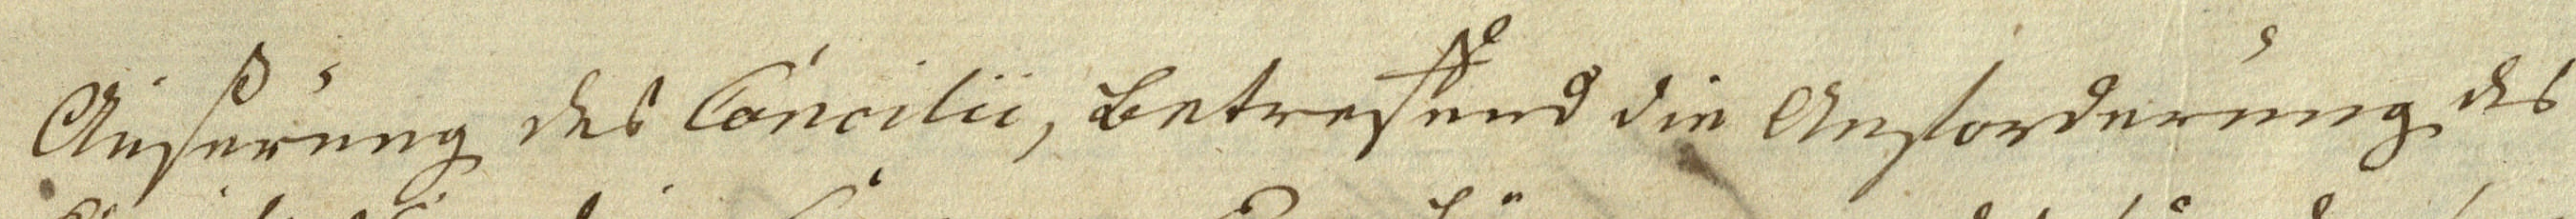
Äußerung des Concilii, betreffend die Anforderung des
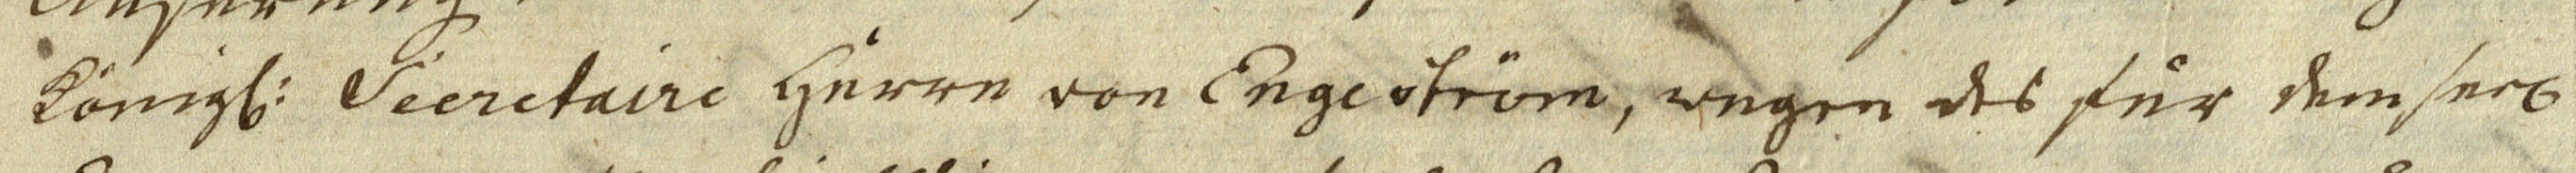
Königl. Secretaire Herrn von Engeström, wegen des für dem seel.
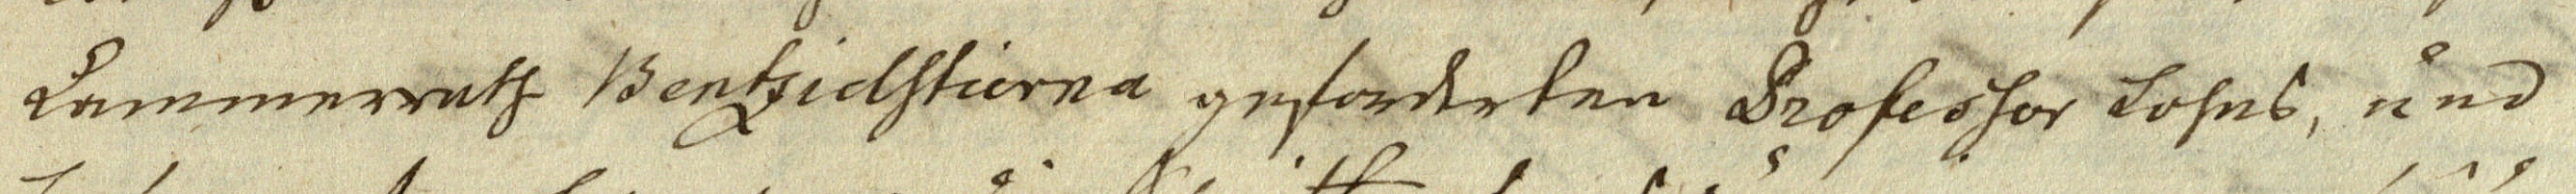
Cammerrath Bentzelstierna geforderten Professor Lohns, und
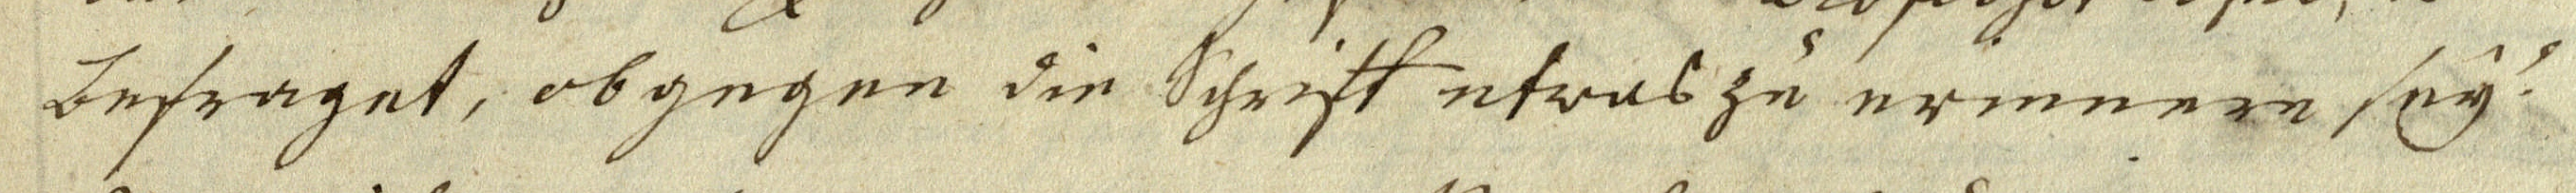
befraget, ob gegen die Schrift etwas zu erinnern seÿ?
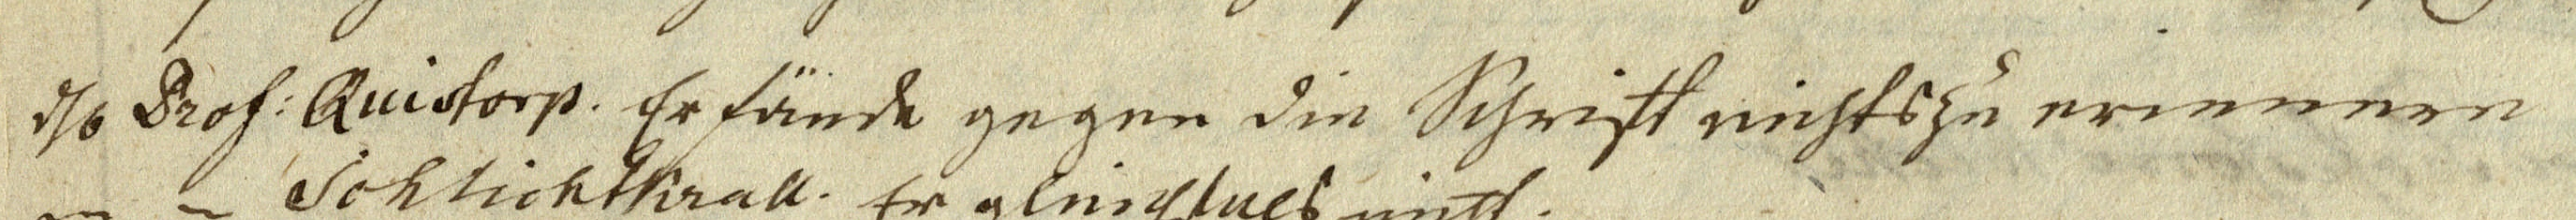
dh Prof. Quistorp. Er fände gegen die Schrift nichts zu erinnern
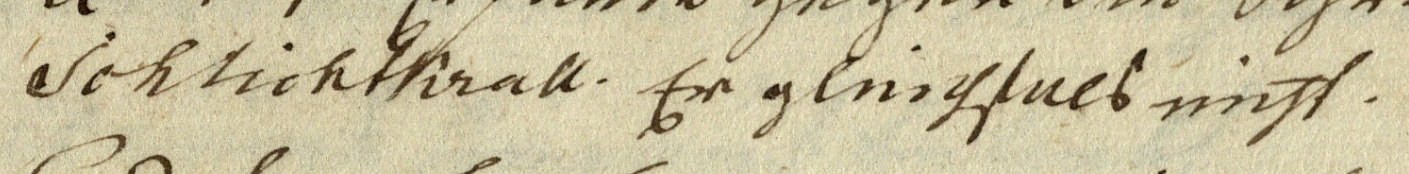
Schlichtkrull. Er gleichfals nicht.
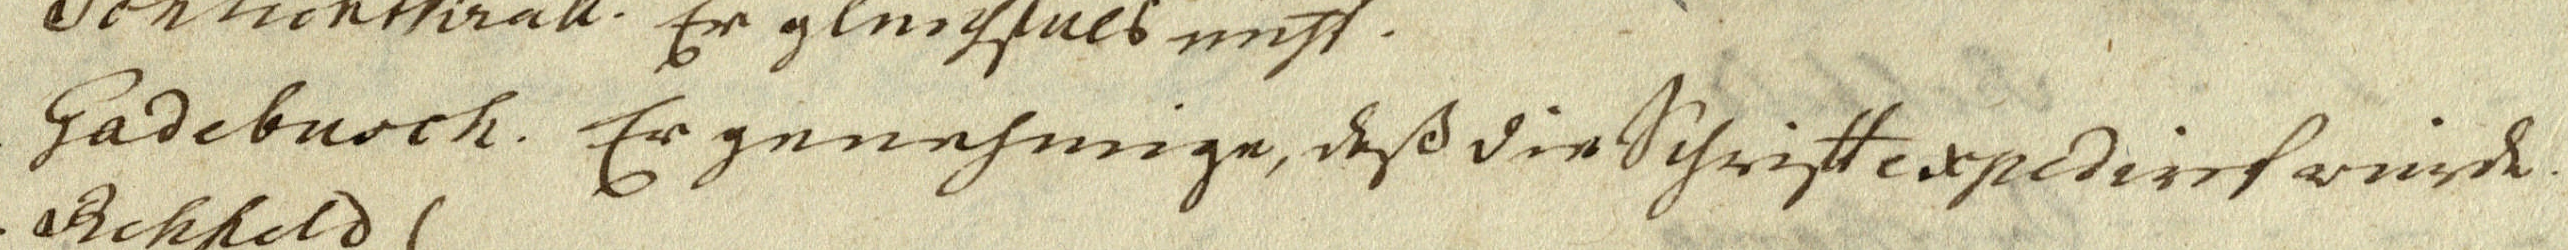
Gadebusch. Er genehmige, daß die Schrift expediret würde.
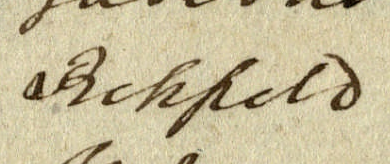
Rehfeld
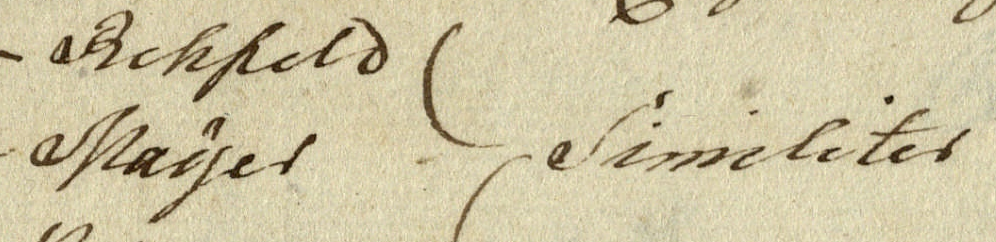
Maÿer Similiter
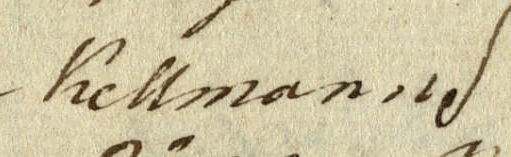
Kellmann
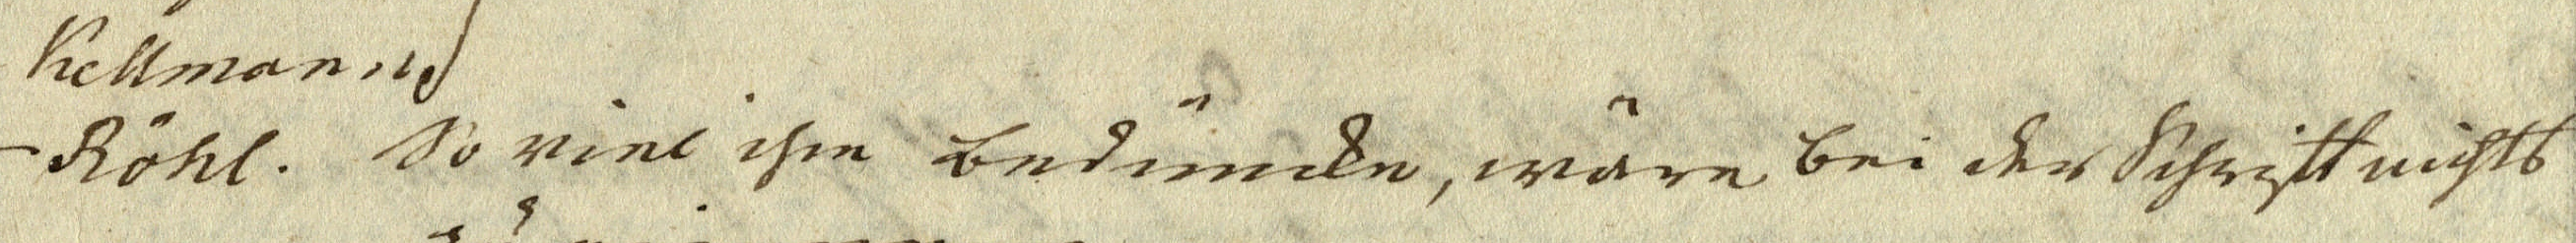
Röhl. So viel ihm bedüncke, wäre bei der Schrift nichts
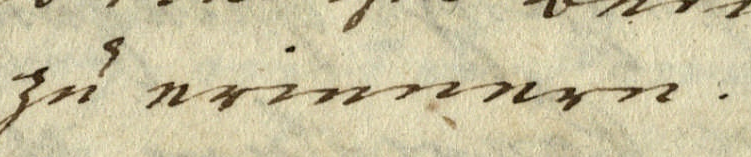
zu erinnern.
